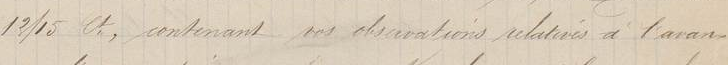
12/15 Ct, contenant vos observations relatives à l'avan-
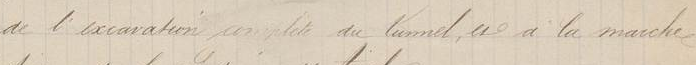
de l'excavation complète du tunnel, et à la marche
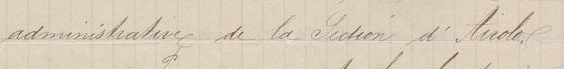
administrative de la Section d'Airolo.
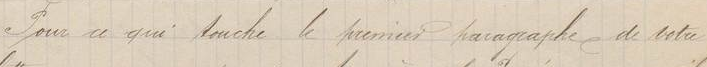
Pour ce qui touche le premier paragraphe de votre
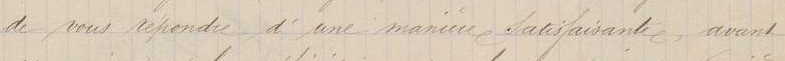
de vous répondre d'une manière satisfaisante, avant
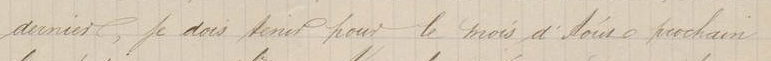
dernier, je dois tenir pour le mois d'Août prochain
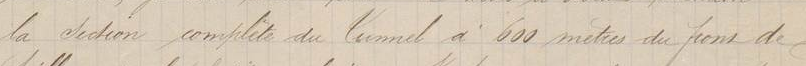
la Section complète du tunnel à 600 mètres du front de
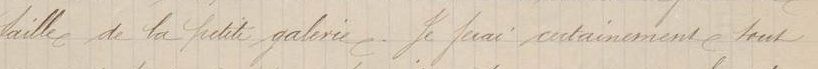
taille de la petite galerie. Je ferai certainement tout
